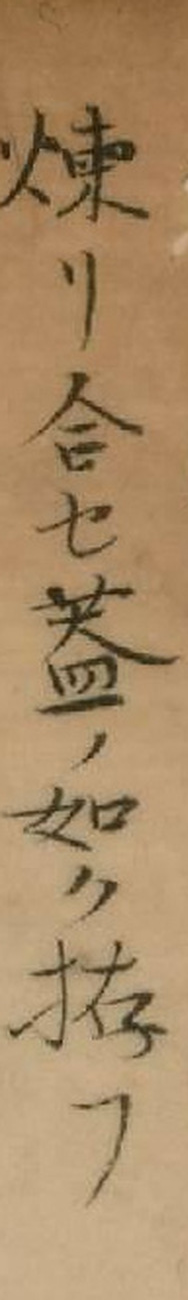煉リ合セ蓋ノ如ク拵フ
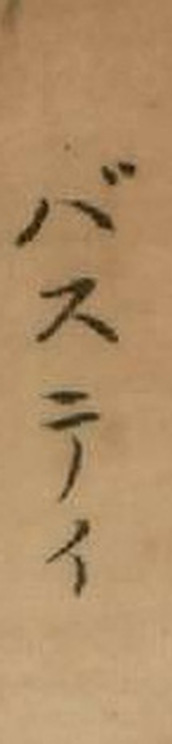バステイ
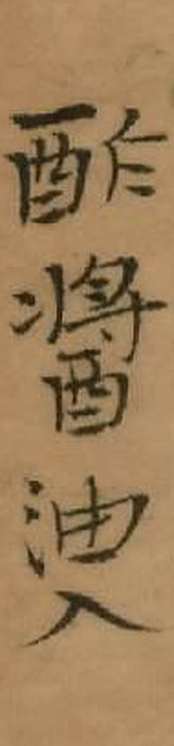酢醤油入
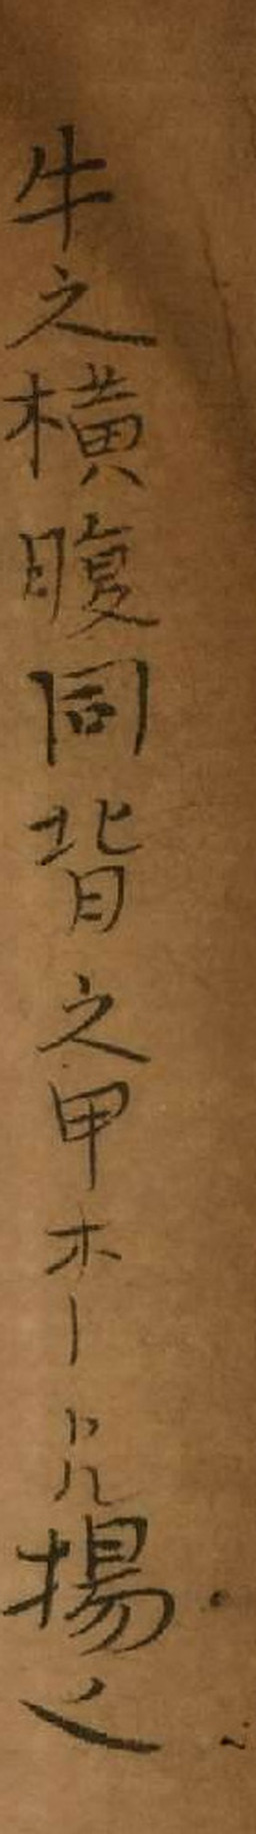牛之横腹同背之甲ホートル揚也
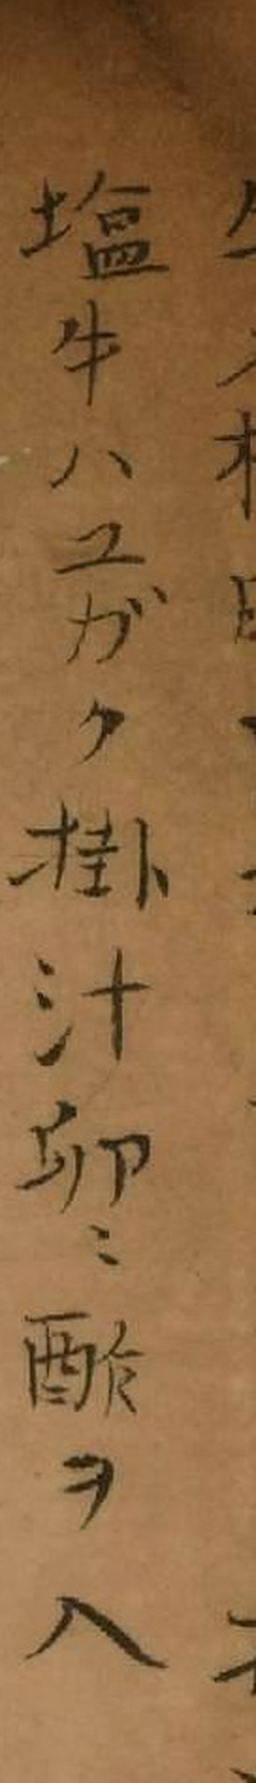塩牛ハユガク掛汁卵ニ酢ヲ入
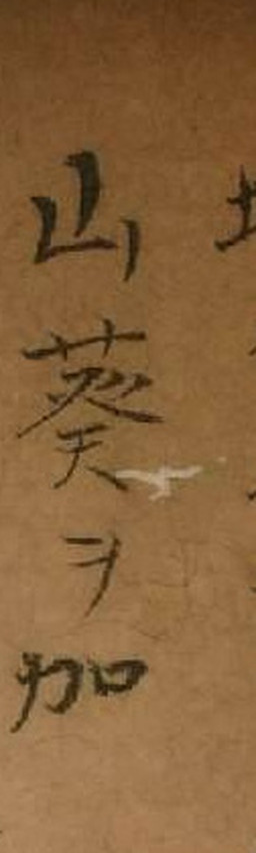山葵ヲ加

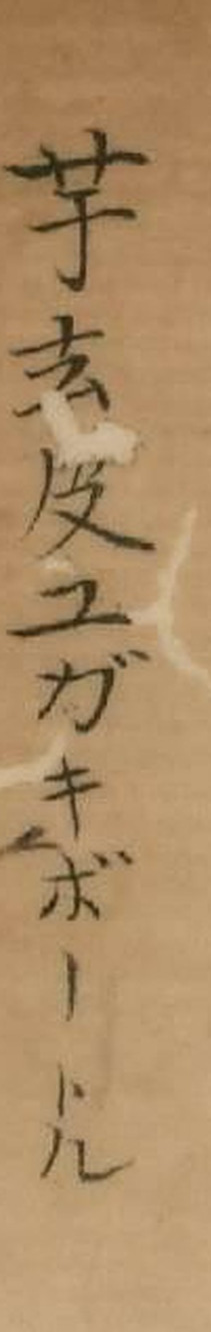芋玄皮ユガキボートル
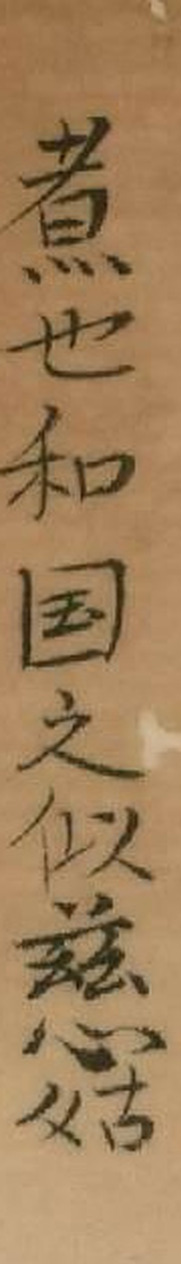煮也和国之似慈姑
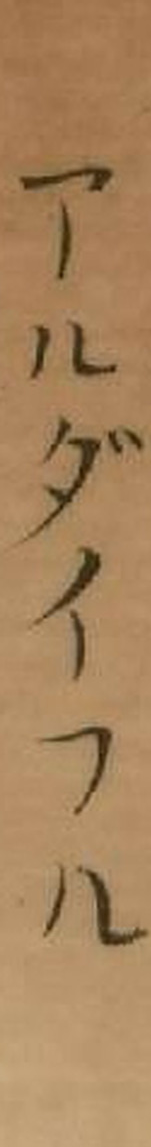アルダイフル
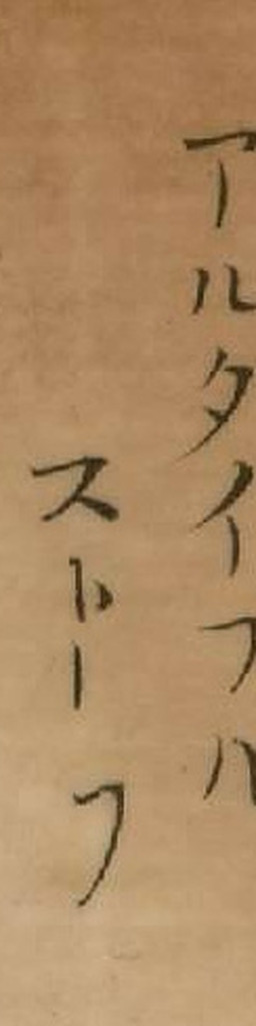ストーフ
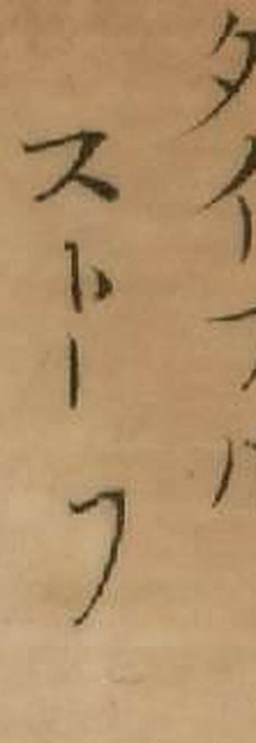ストーフ
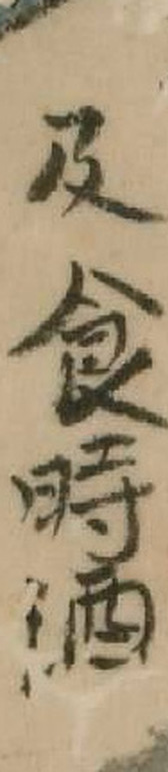及食時酒
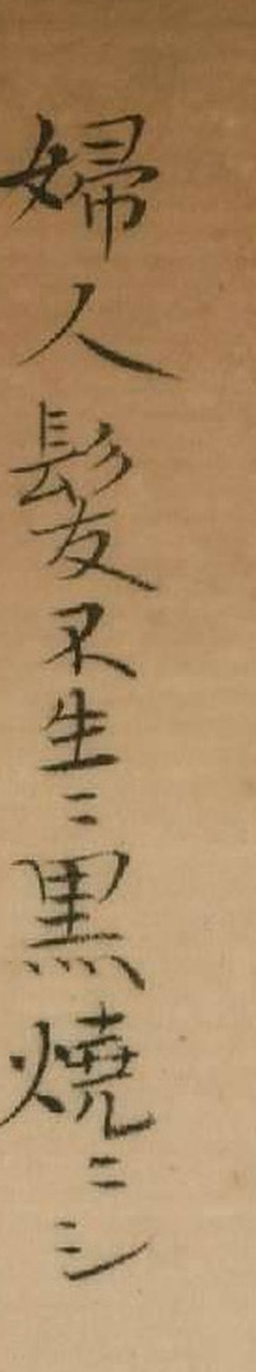婦人髪不生ニ黒焼ニシ
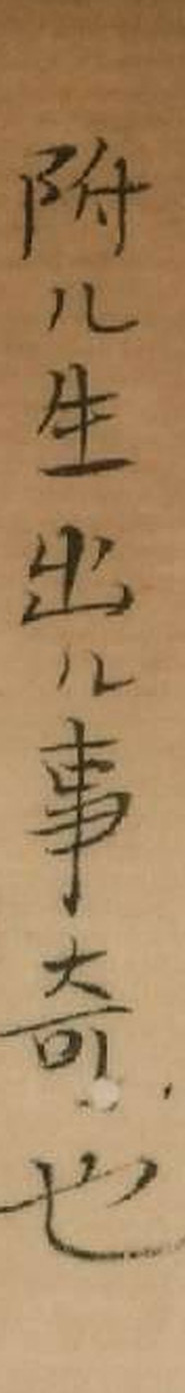附ル生出ル事奇也
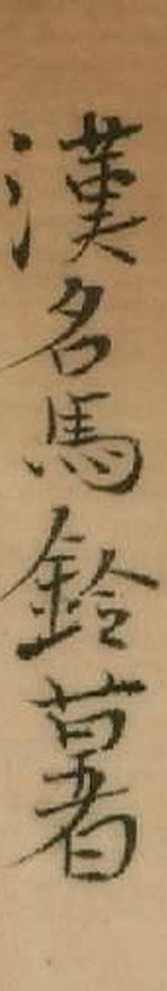漢名馬鈴薯
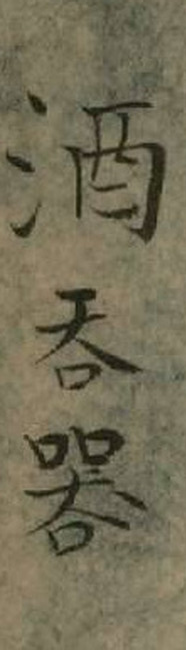酒呑器
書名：和蘭規式料理絵図
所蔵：神戸大学附属図書館 国文学研究資料館
